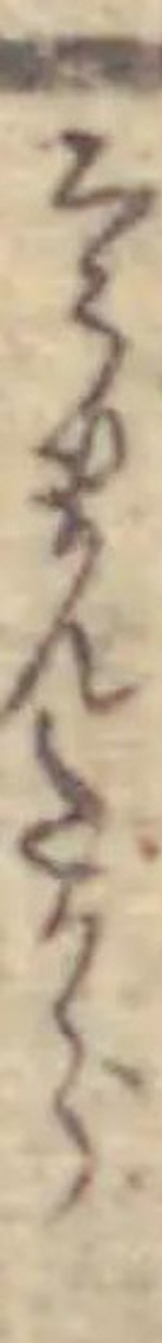こうまんたから
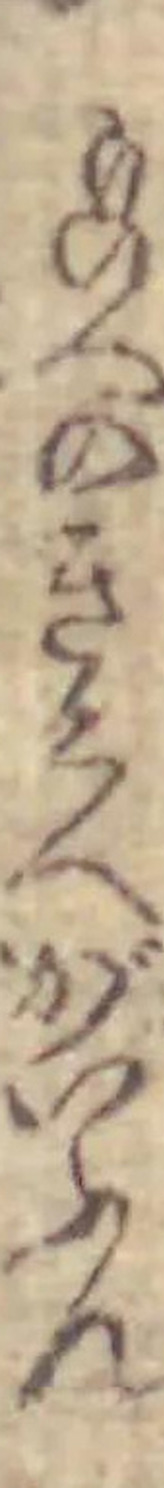ものへのきこへがいふん
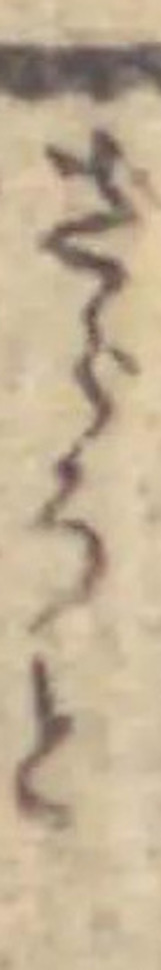さらうと
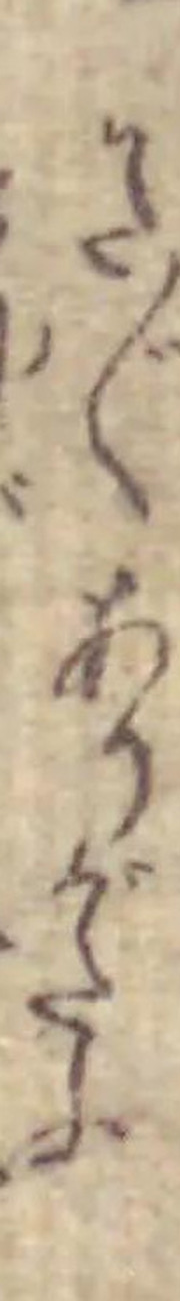かた〴〵ありがたふ
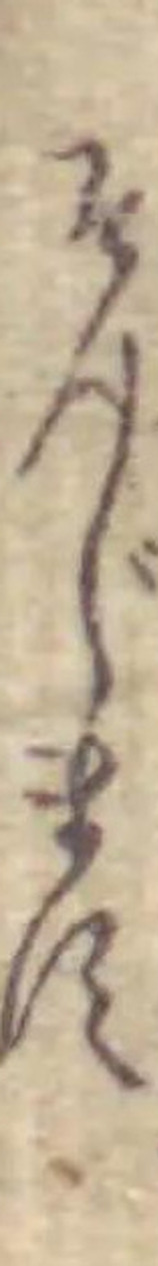そんじます
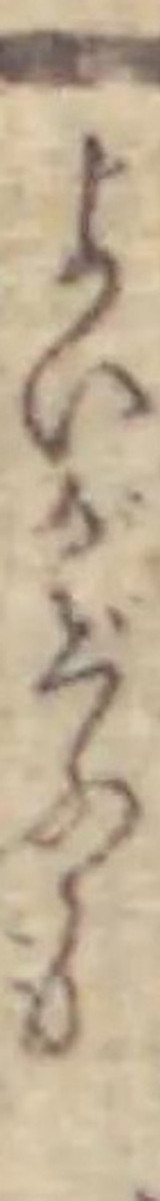よいがどうふも
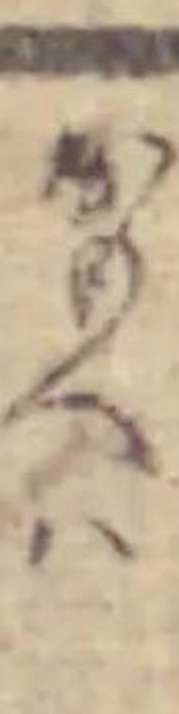おもへは
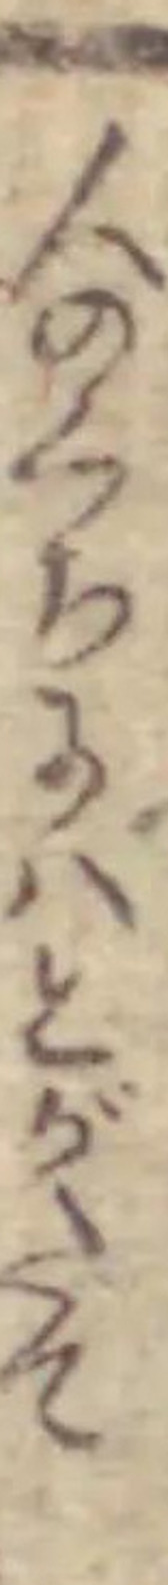人のくちにはとがたて
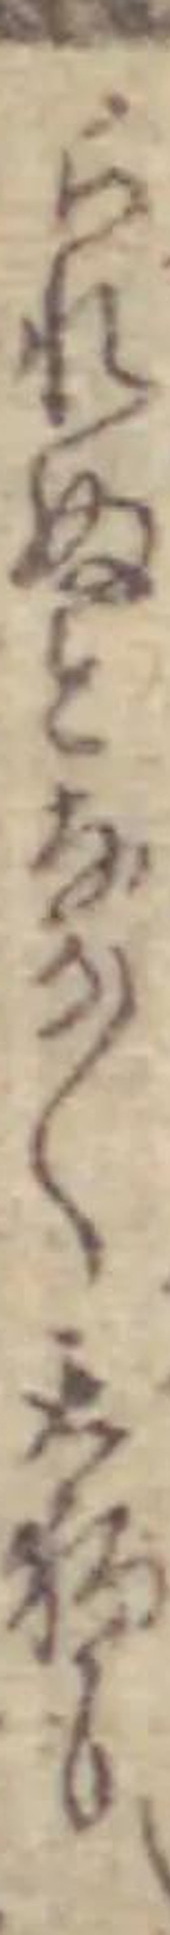られぬとなか〳〵天狗も
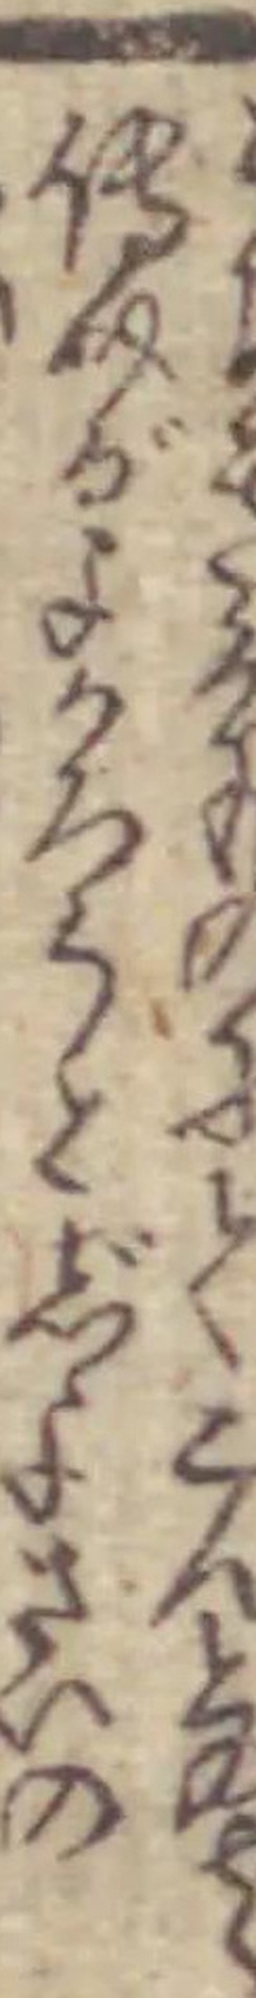伝介がよかろうとじよさいの
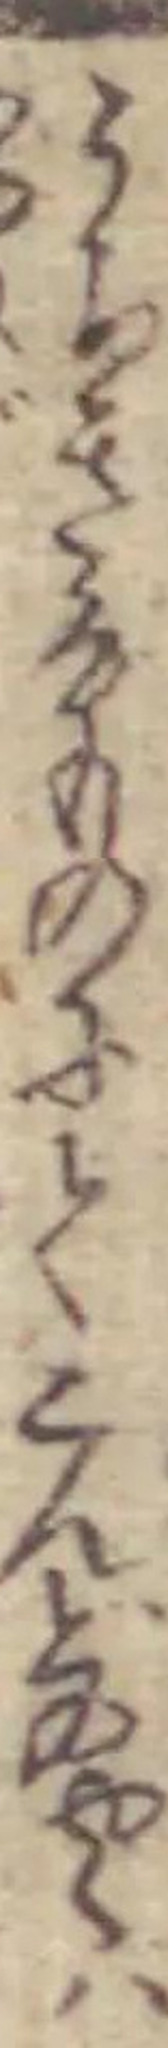うちきなものにてこんどのやくハ
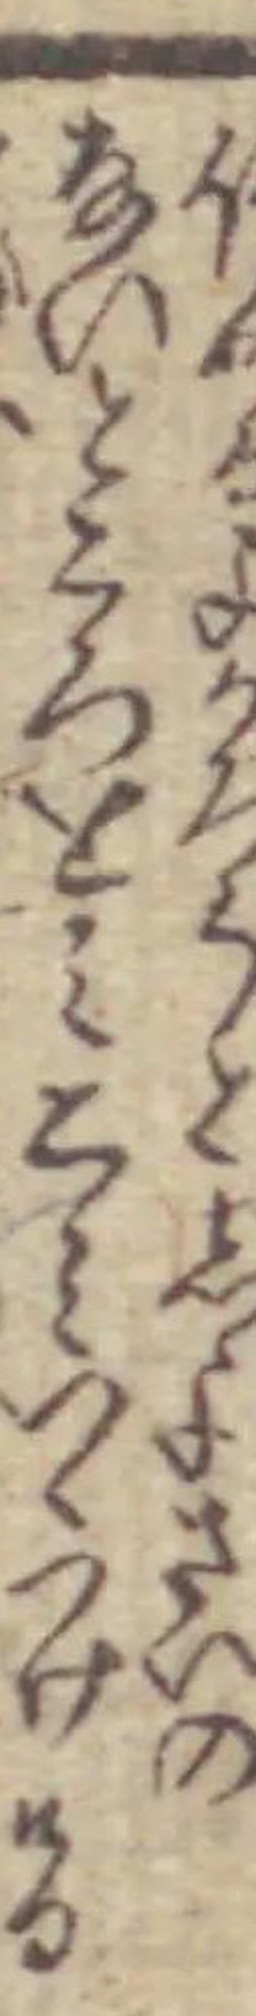ないところをみこみいゝつけける
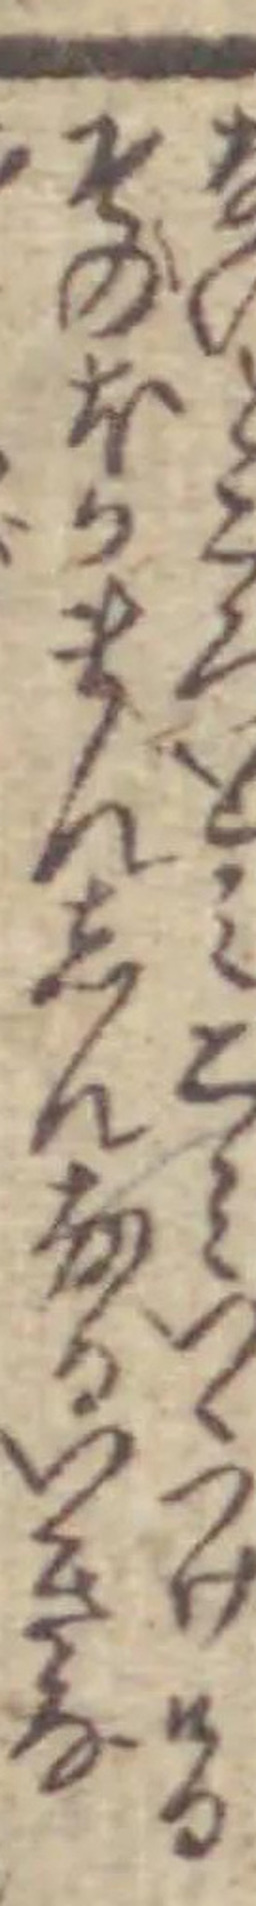そのほかまんしんなるいきな
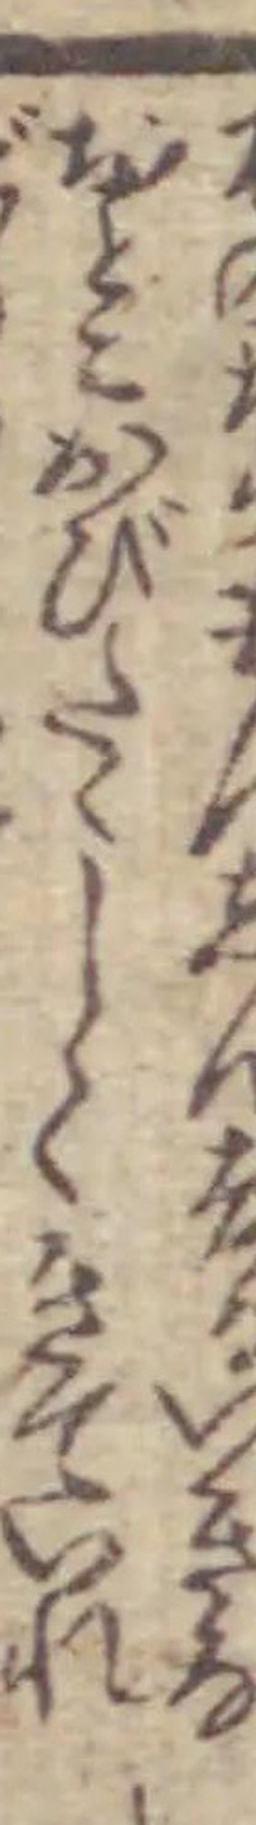おとこおびたゝしくきていれ
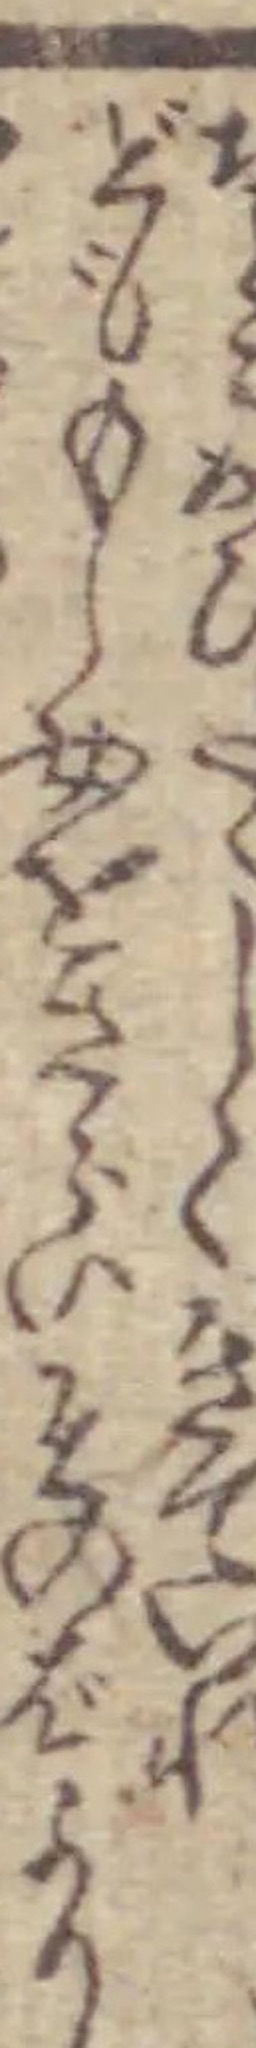どももし女をさらいそのばより
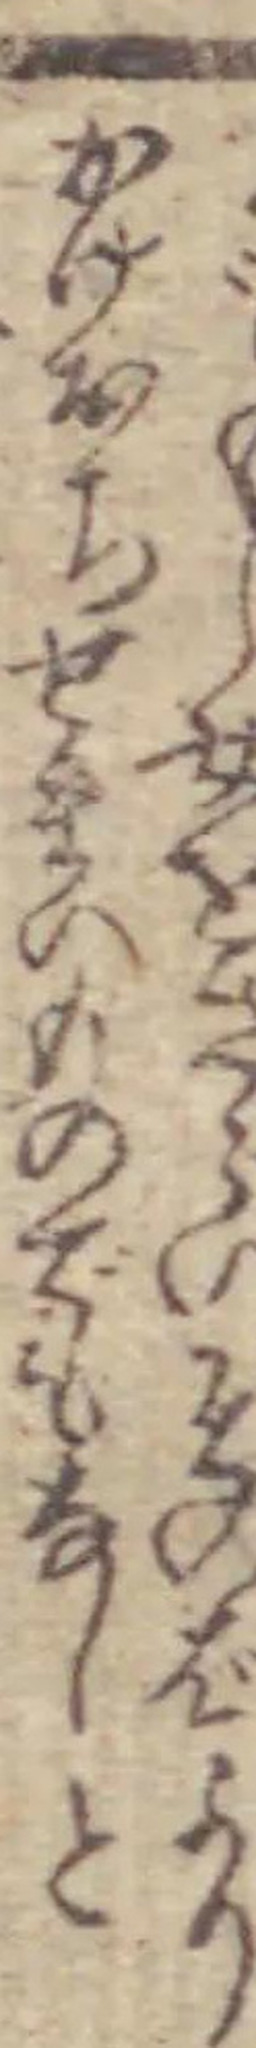かけおちせまいものでもなしと
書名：珍説女天狗 2巻
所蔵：国立国会図書館 National Diet Library, JAPAN
